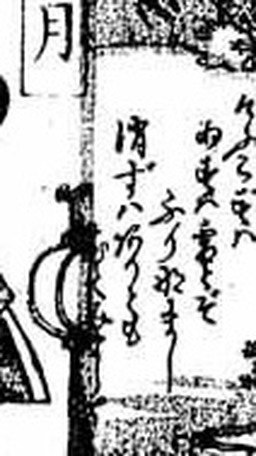消ずはありとも
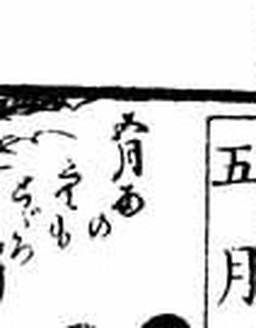五月雨の
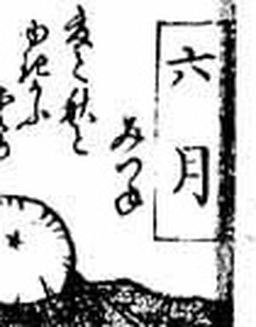みつね
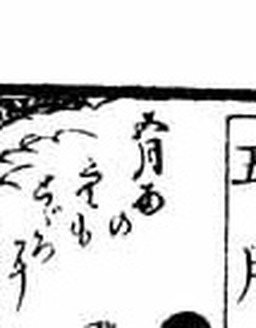五月雨の
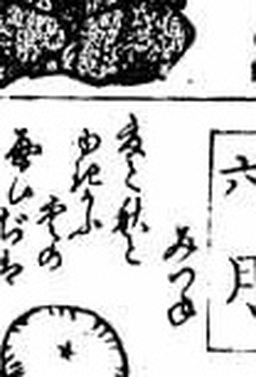夏と秋と
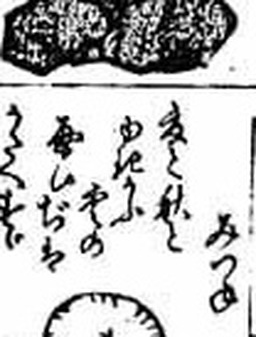ゆきかふ
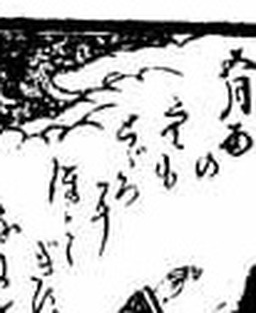とゞろ
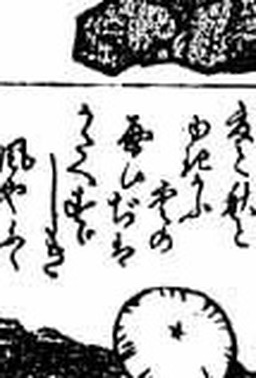通ひぢは
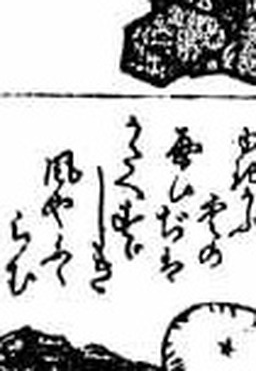かたへすゞ
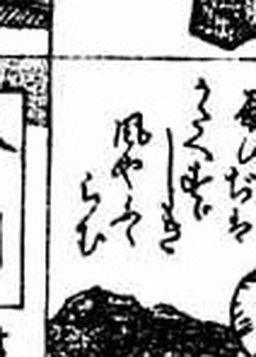風やふく
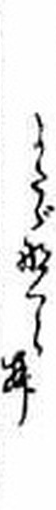よたゞなくら
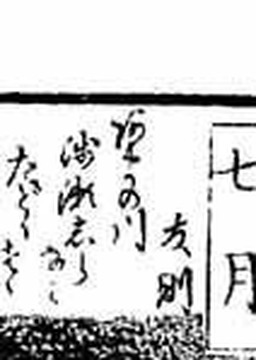あまの川
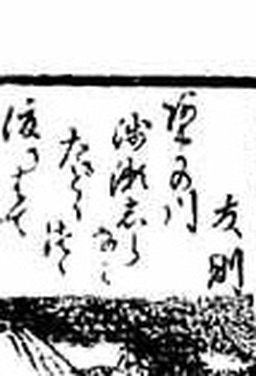浅瀬しら
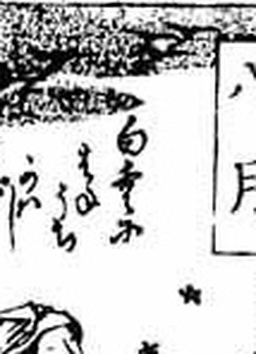白雲に
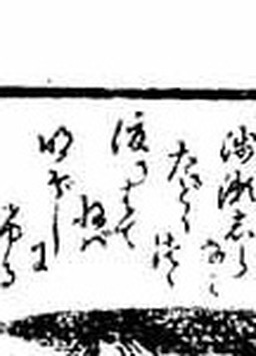渡りはて

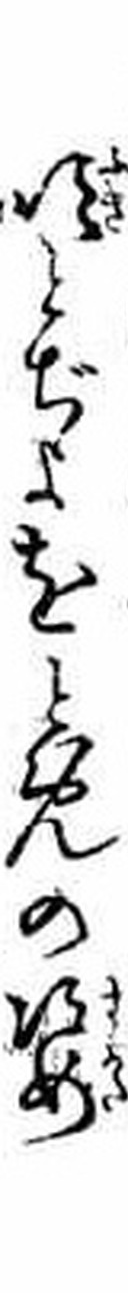吹とぢよをとめの姿とゞ
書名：小倉百人一首
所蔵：東京学芸大学教育コンテンツアーカイブ
